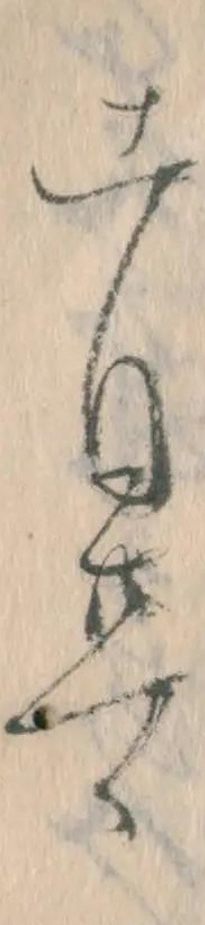十一月廿一日

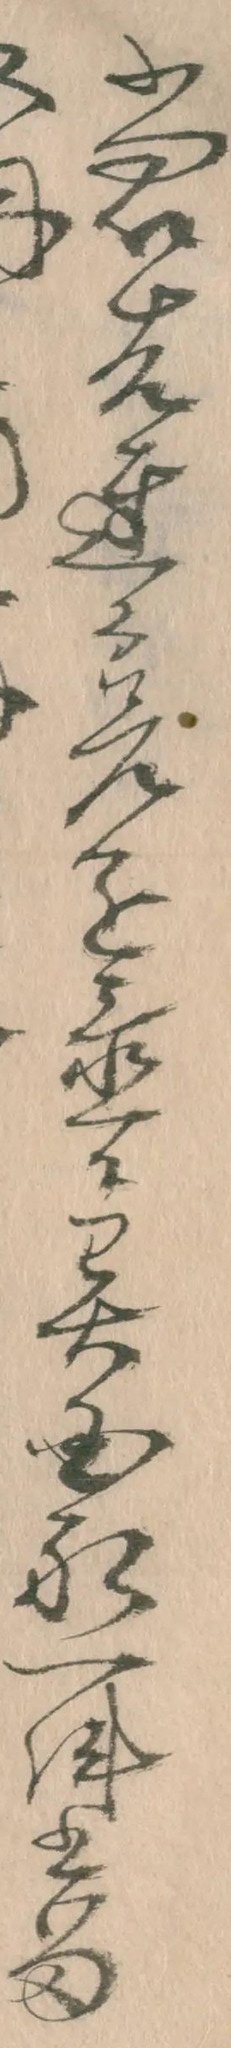尚以先達而差進置候異国船一件書留
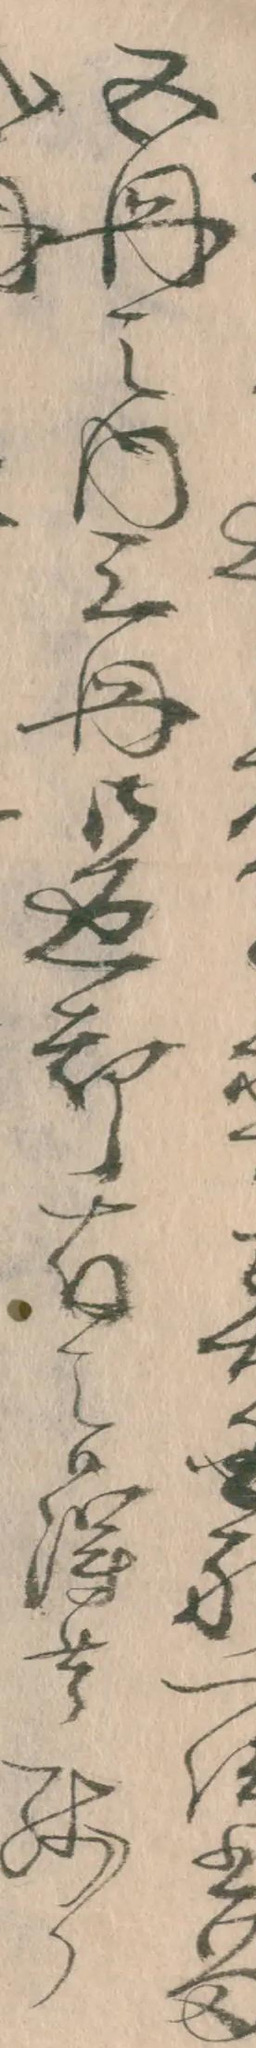五冊之内三冊御返却有之候得共残り
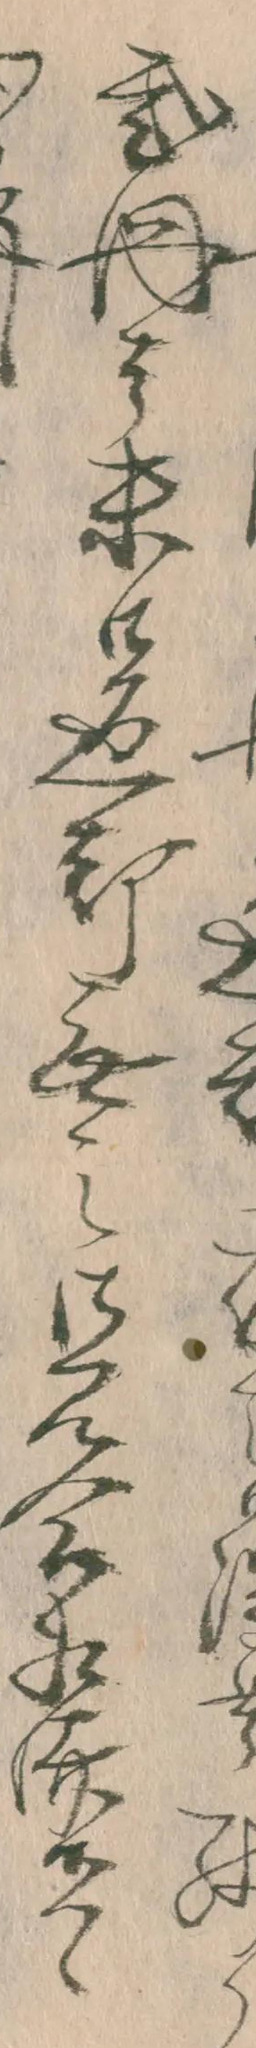弐冊は未御返却無之御見合相済候ハヽ
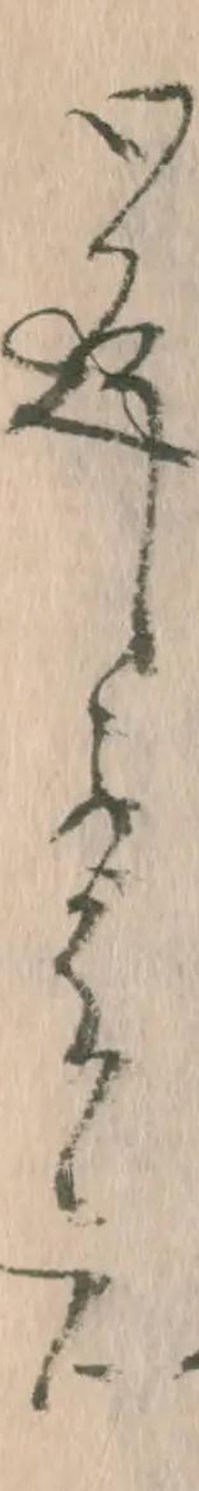御返し可被下候以上
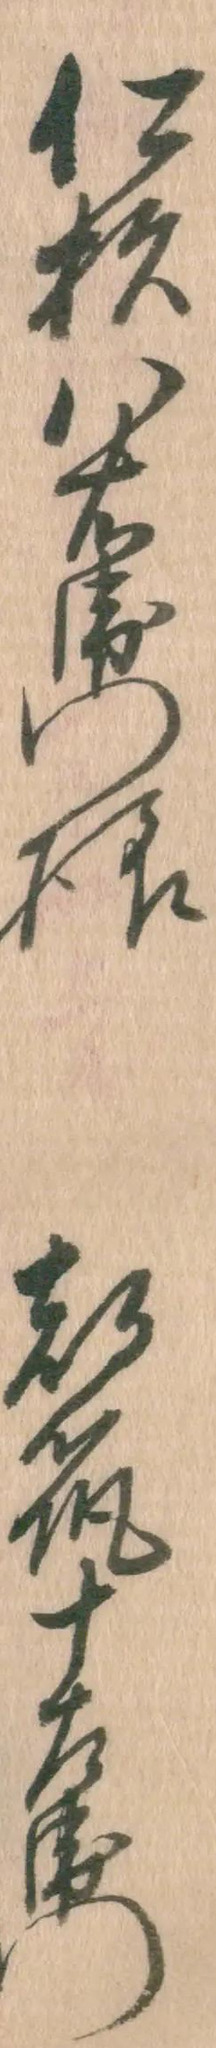仁杉八右衛門様都筑十左衛門
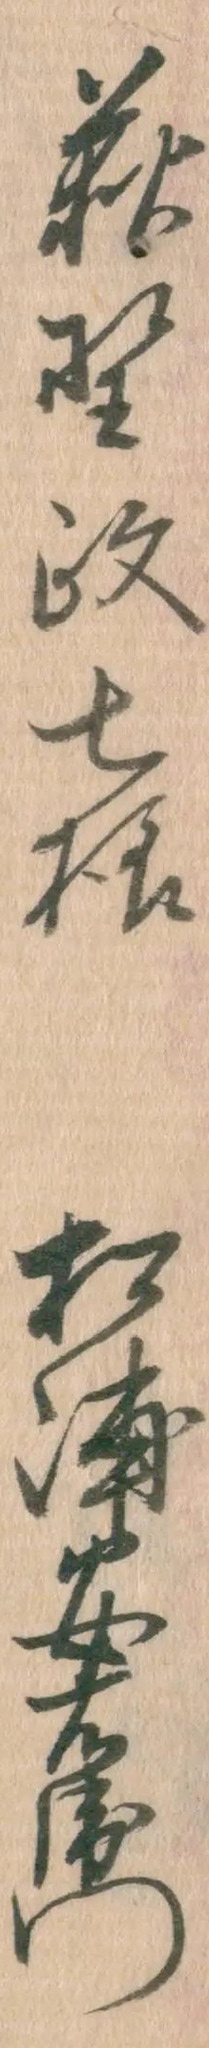荻野政七様松浦安右衛門
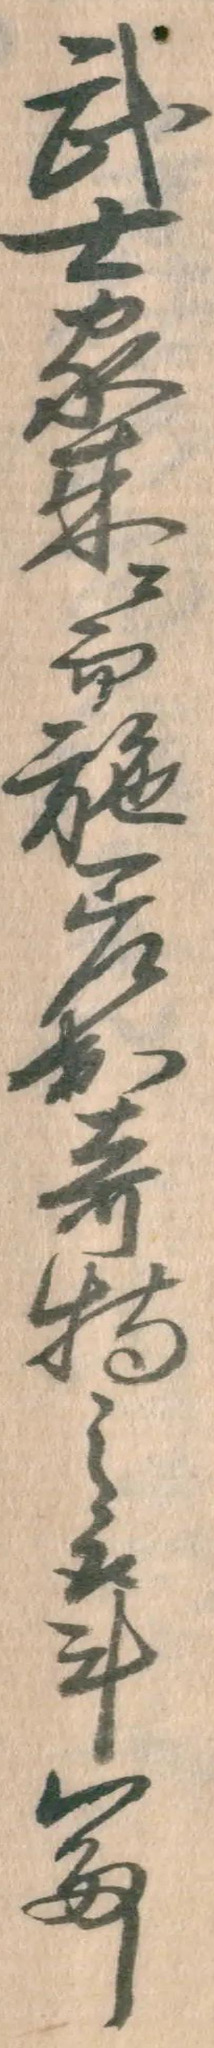武士家来ニ而施差出奇特之取計いたし
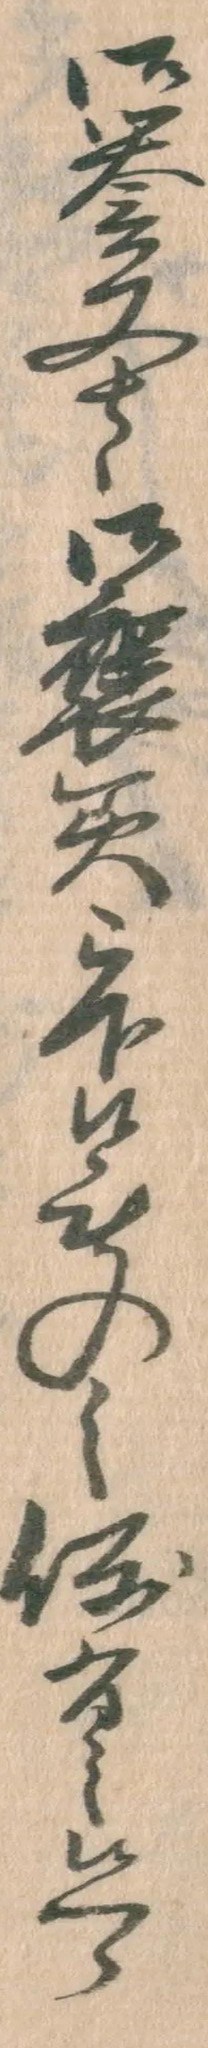御誉又は御褒美被下候もの之例有之候ハヽ
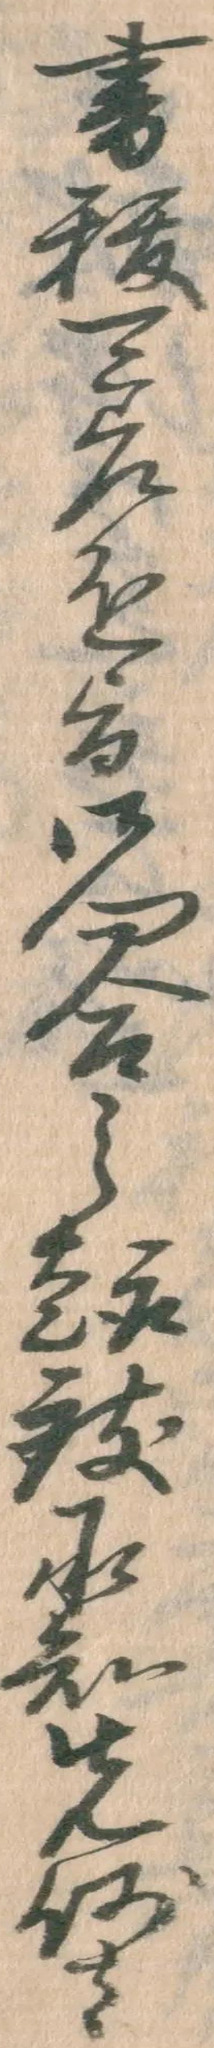書抜可差進旨御問合之趣致承知先何は
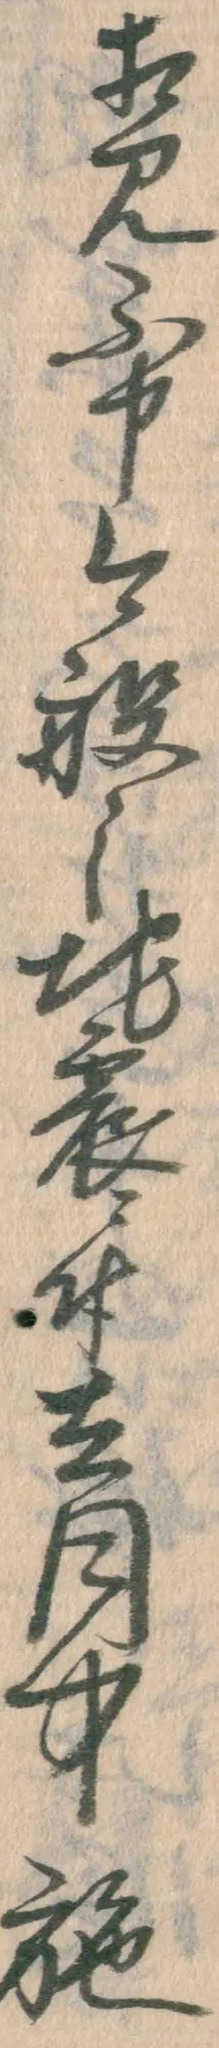相見不申今般之地震ニ付去月中施
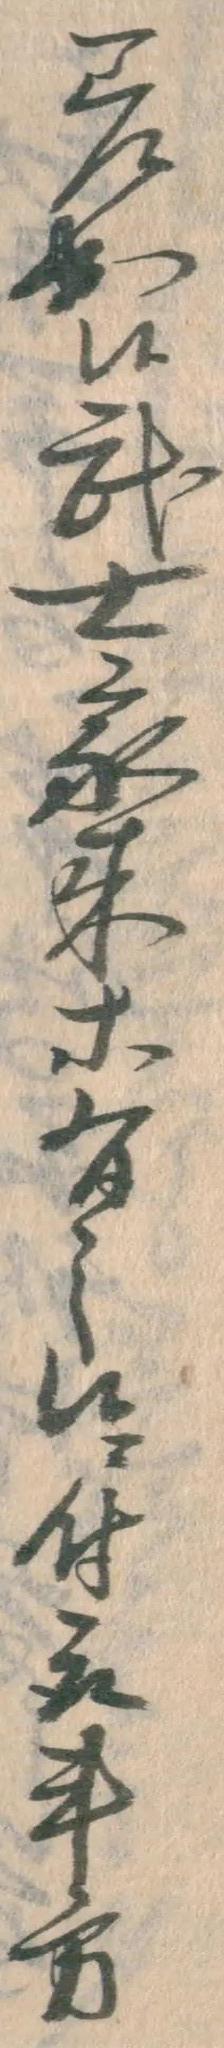差出候武士家来等有之候ニ付取計方

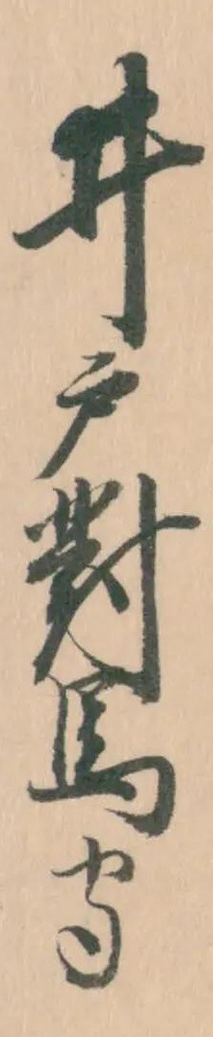井戸対馬守

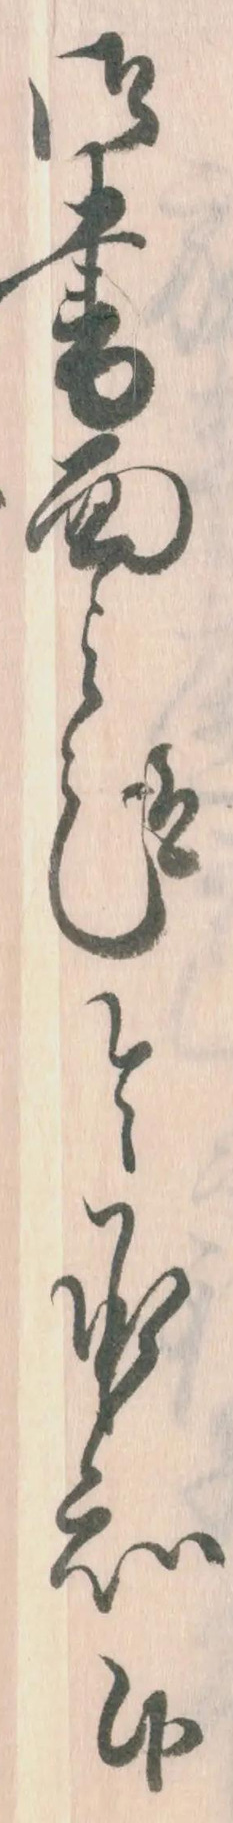御書面之趣令承知候
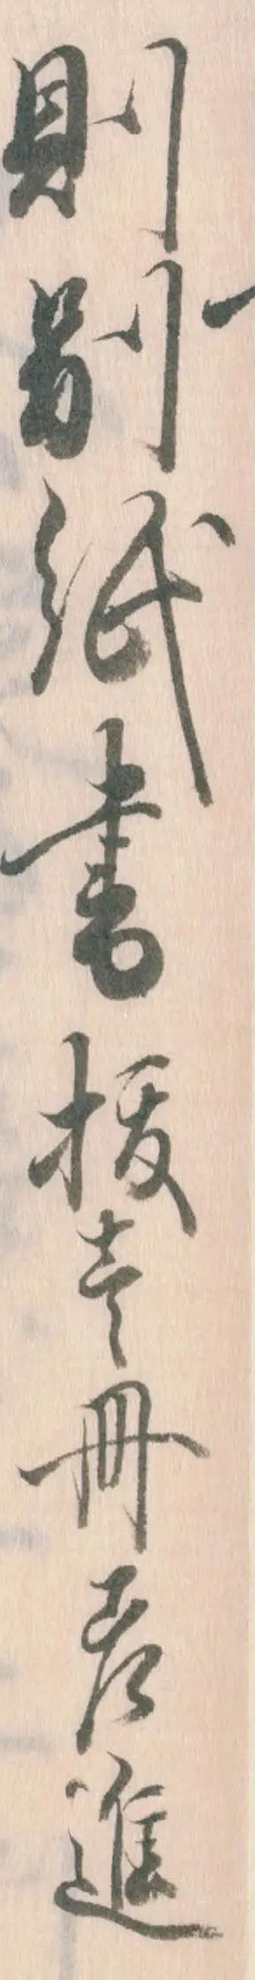則別紙書抜壱冊差進
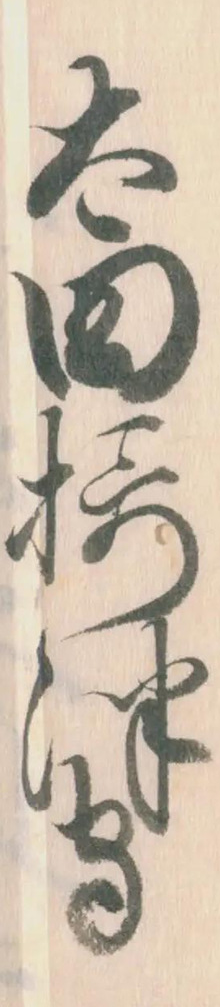十月太田摂津守
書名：武家方并寺院等ニテ施差出候一件
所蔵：国立国会図書館 National Diet Library, JAPAN
